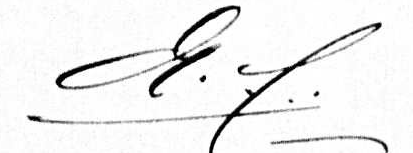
AE
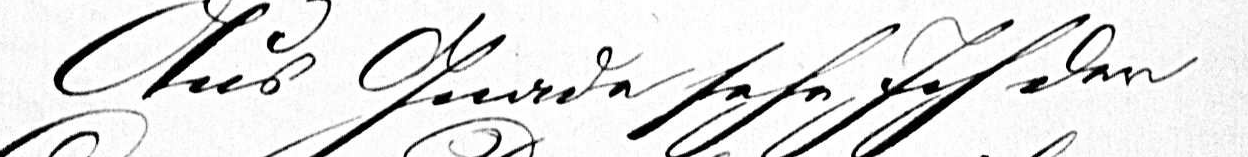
Aus Gnade sehe Ich den
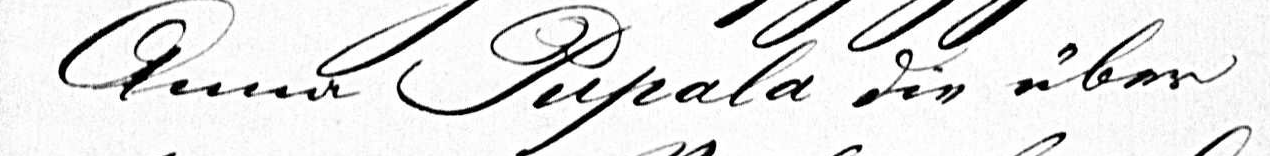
Anna Pupala die über
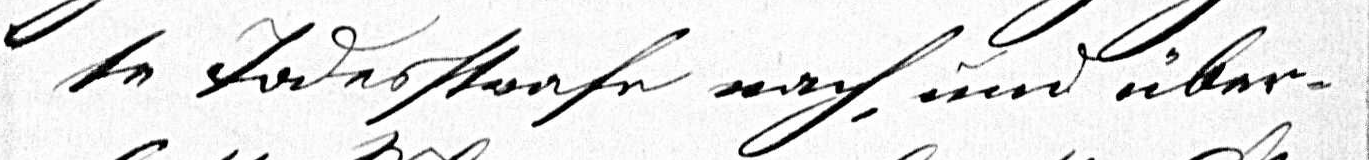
te Todesstrafe nach, und über¬
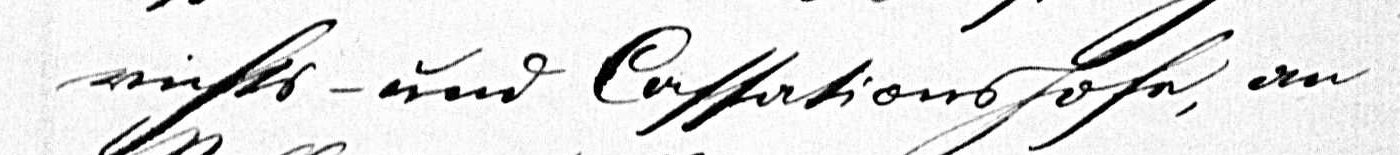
richts- und Cassationshofe, an
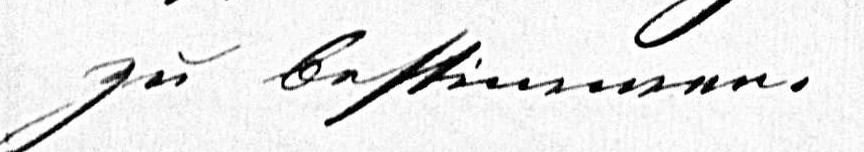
zu bestimmen.
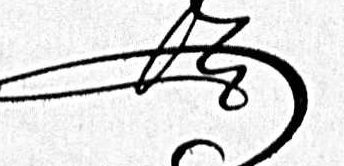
FJ
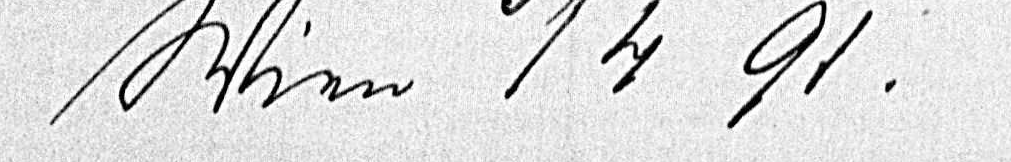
Wien 3/4 1891
